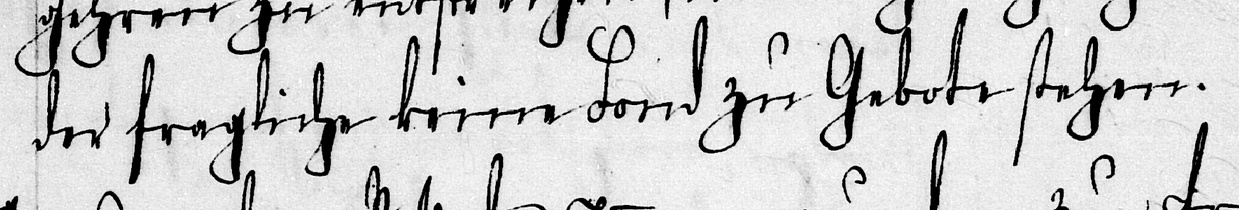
der fragliche keine Fond zu Gebote stehen.
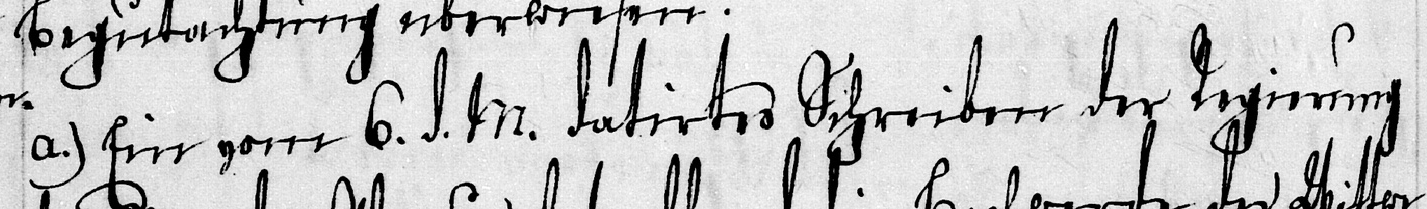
a.) Ein vom 6. d. M. datirtes Schreiben der Regierung
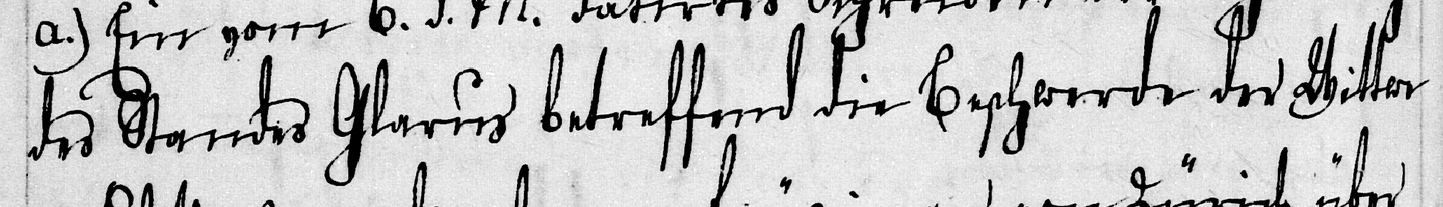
des Standes Glarus betreffend die Beschwerde der Wittwe
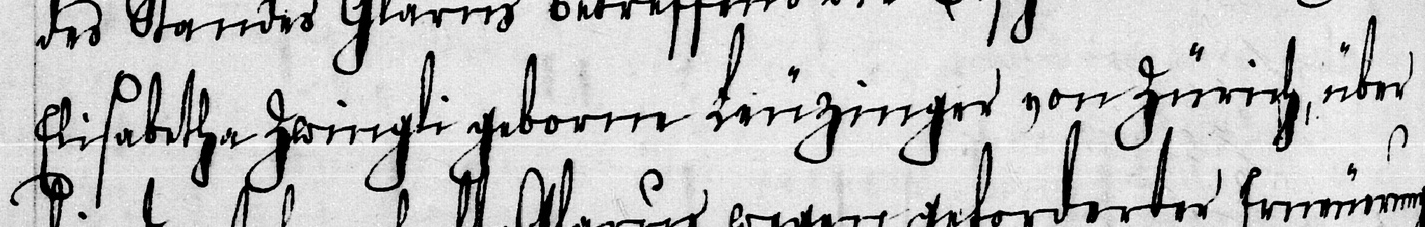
Elisabetha Zwingli geborne Leuzinger von Zürich, über
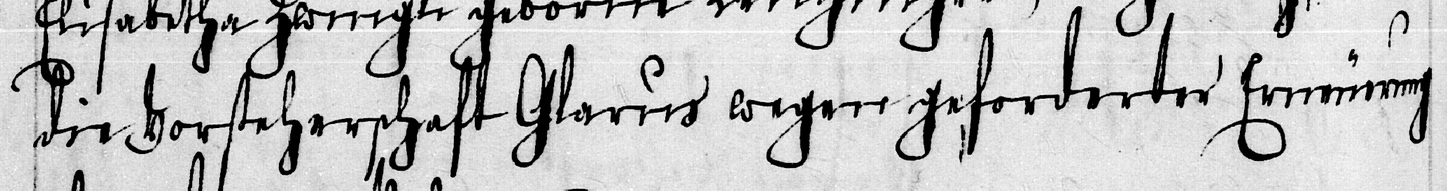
die Vorsteherschaft Glarus wegen geforderter Erneuerung
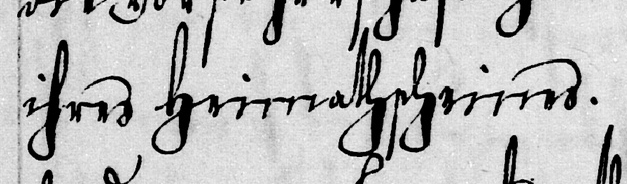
ihres Heimathscheines.
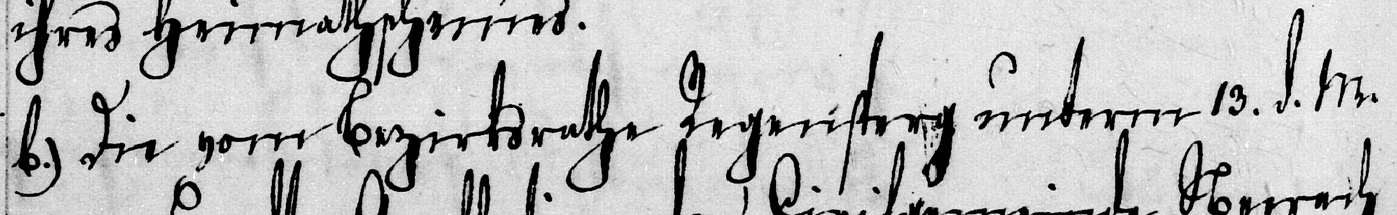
b.) Die vom Bezirksrathe Regensperg unterm 13. d. M.
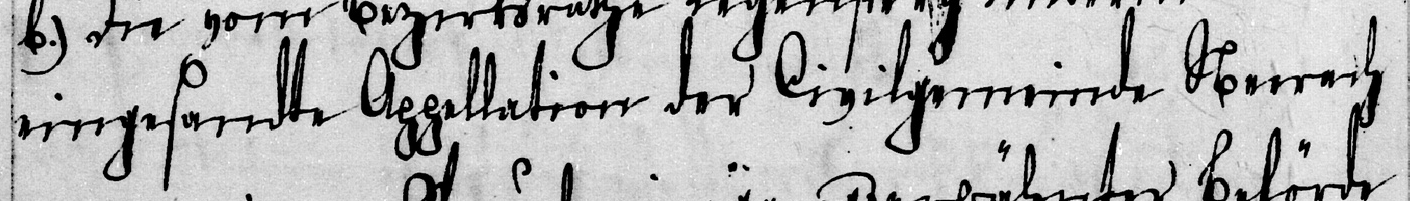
eingesandte Appellation der Civilgemeinde Neerach
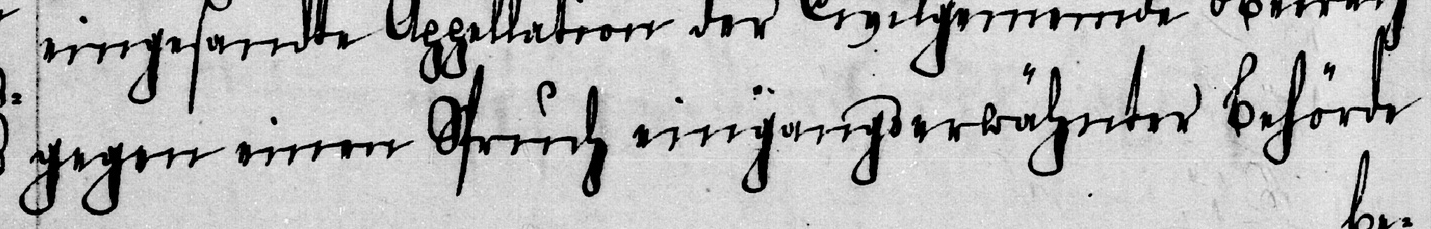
gegen einen Spruch eingangserwähnter Behörde
